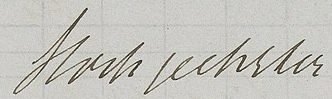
Hochgeehrter Herr
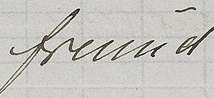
Freund.
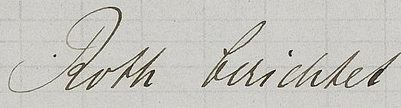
Roth berichtet
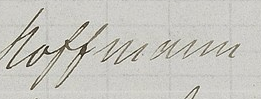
Hoffmann
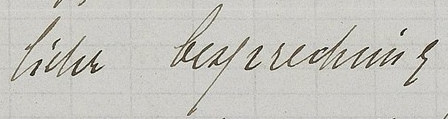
licher Besprechung
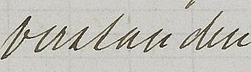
verstanden
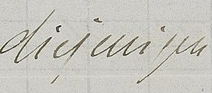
diejenigen
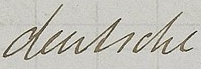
deutsche
